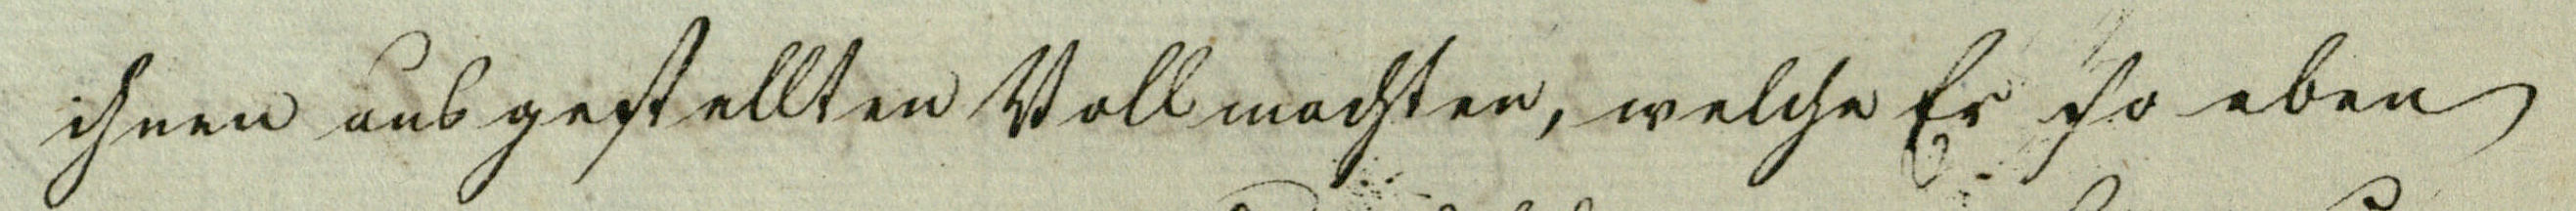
ihnen ausgestellten Vollmachten, welche Er so eben
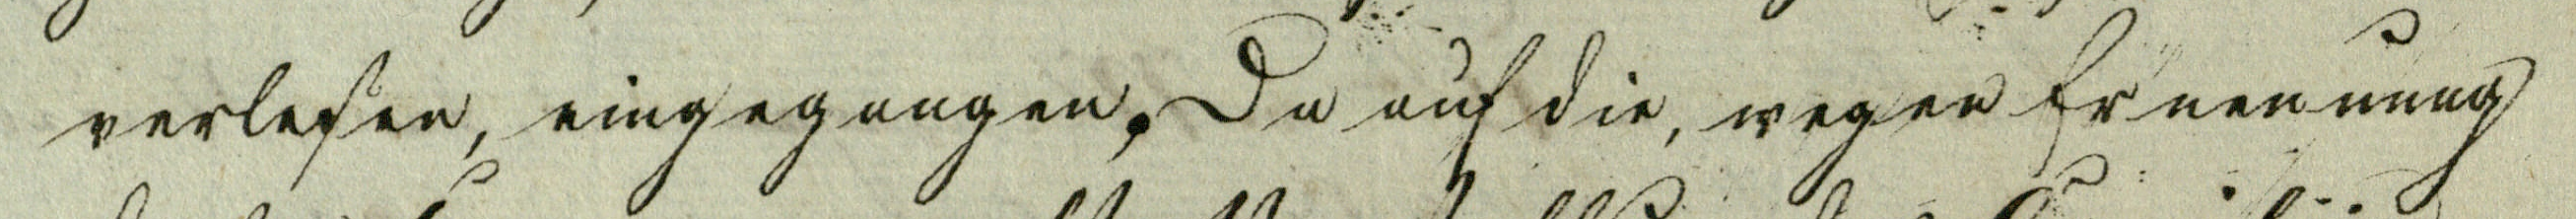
verlesen, eingegangen. Da auf die, wegen Ernennung
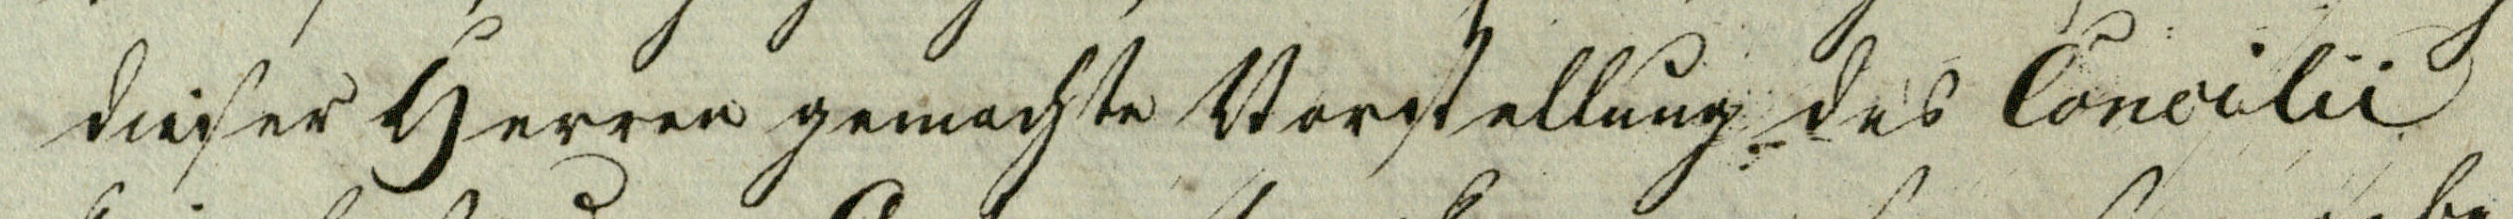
dieser Herren gemachte Vorstellung des Concilii
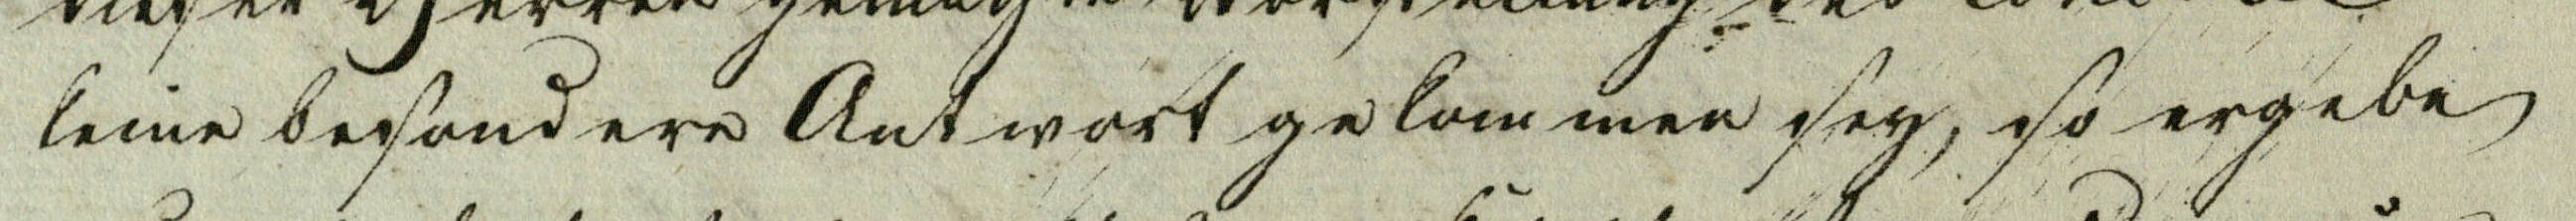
keine besondere Antwort gekommen sey, so ergebe
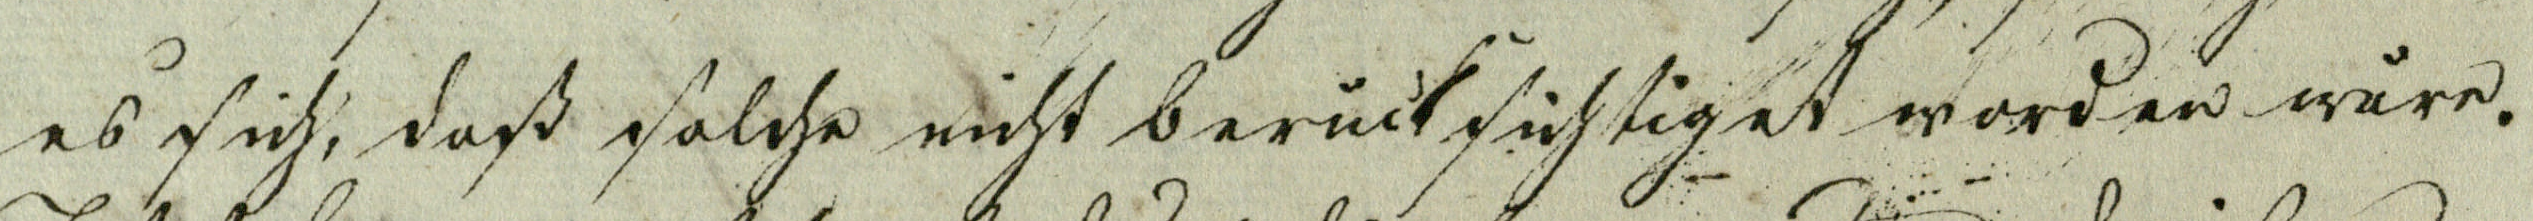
es sich, daß solche nicht berücksichtiget worden wäre.
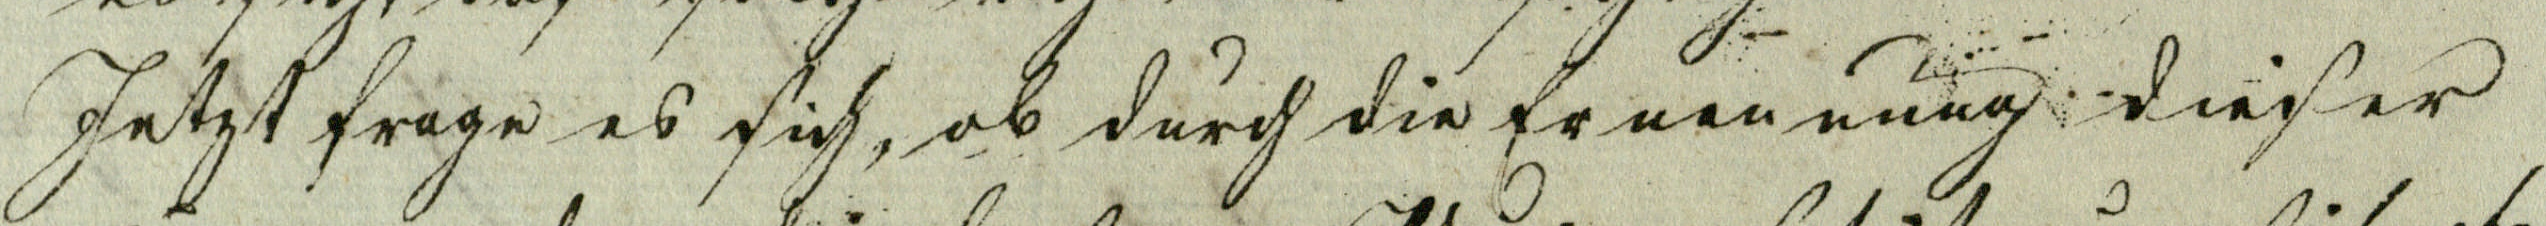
Jetzt frage es sich, ob durch die Ernennung dieser
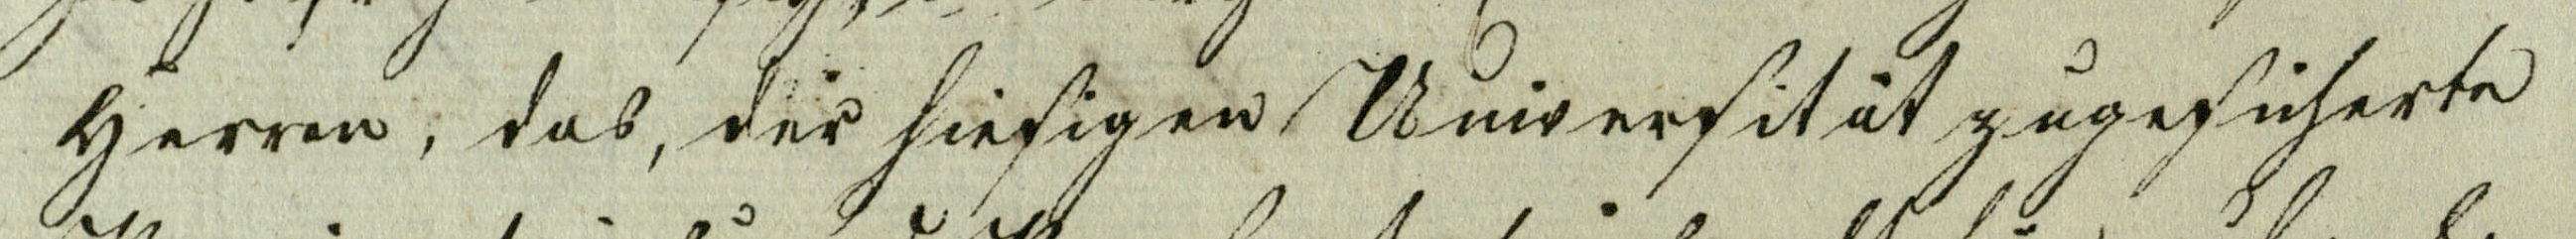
Herren, das, der hiesigen Universität zugesicherte
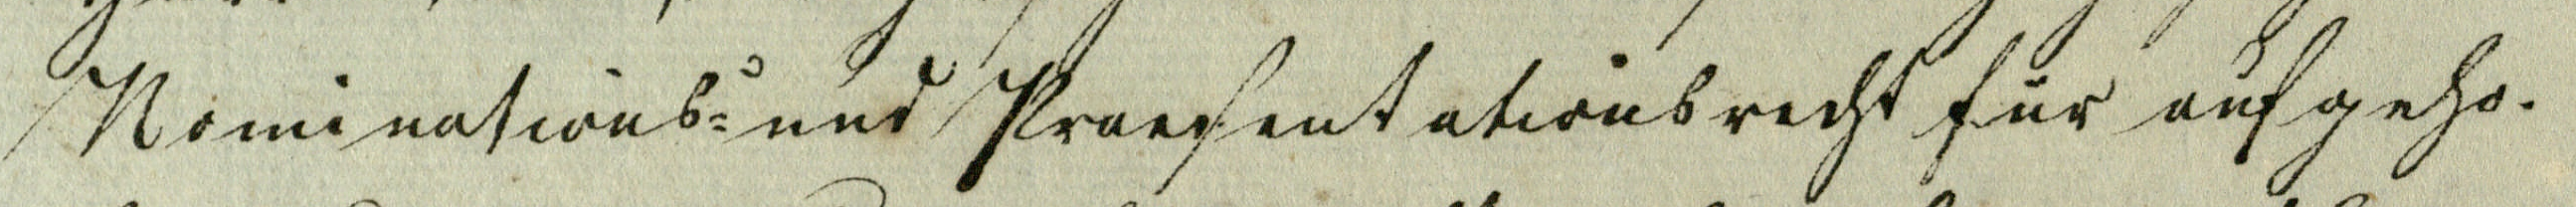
Nominations- und Praesentationsrecht für aufgeho¬
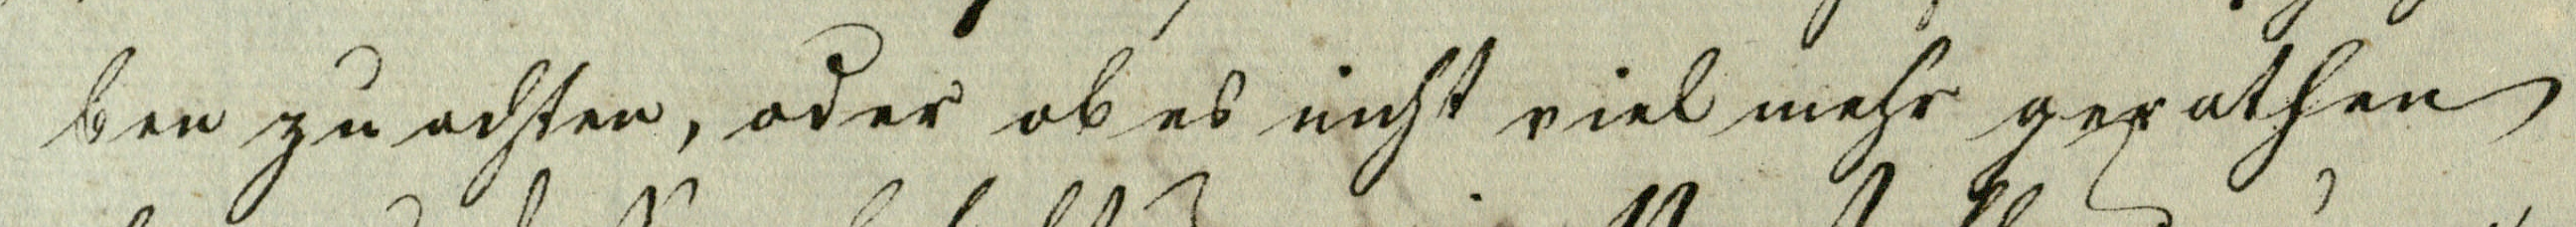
ben zu erachten, oder ob es nicht vielmehr gerathen
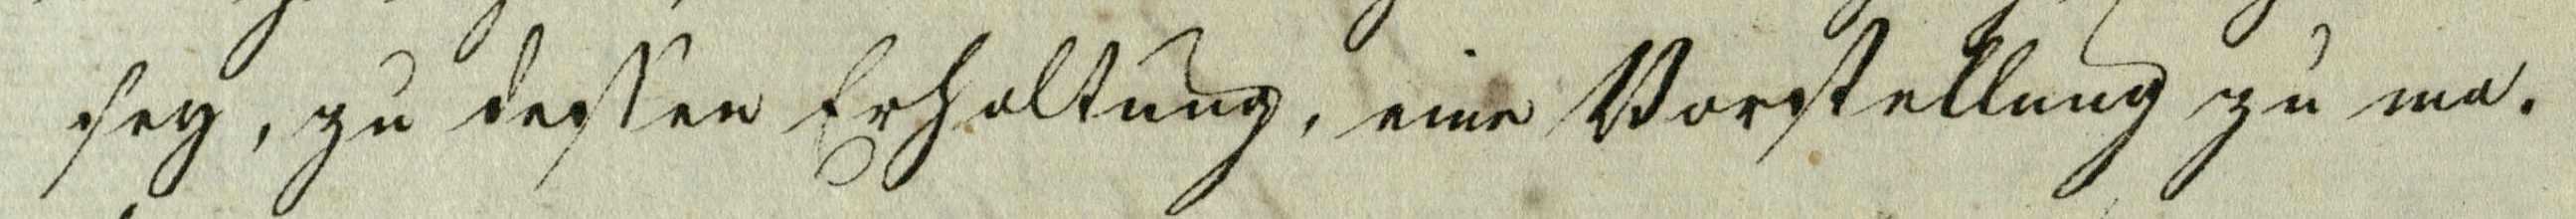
sey, zu dessen Erhaltung, eine Vorstellung zu ma¬
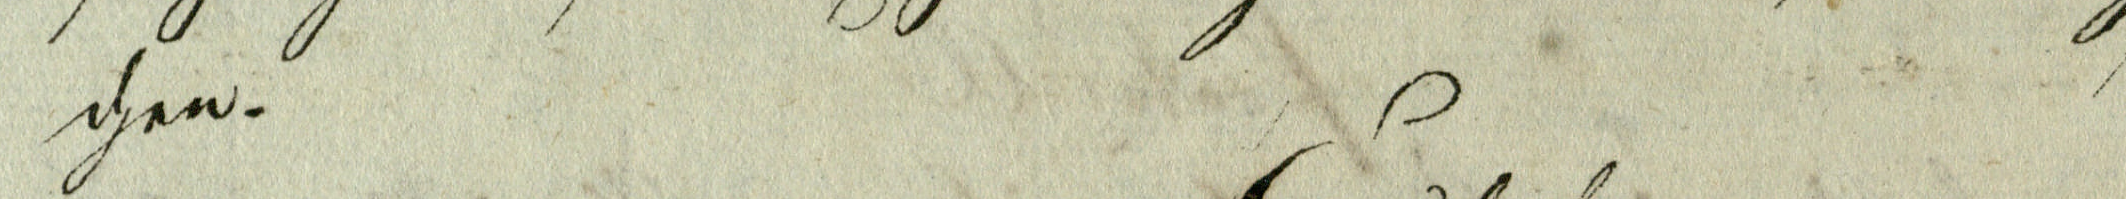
chen.
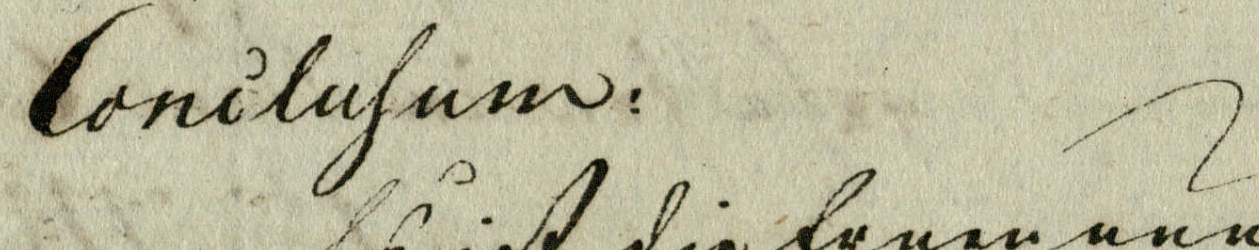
Conclusum:
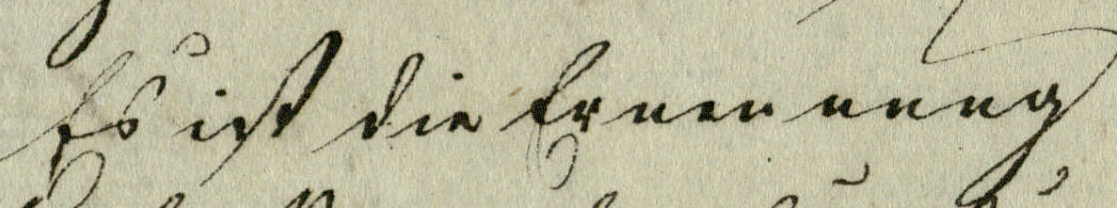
Es ist die Ernennung
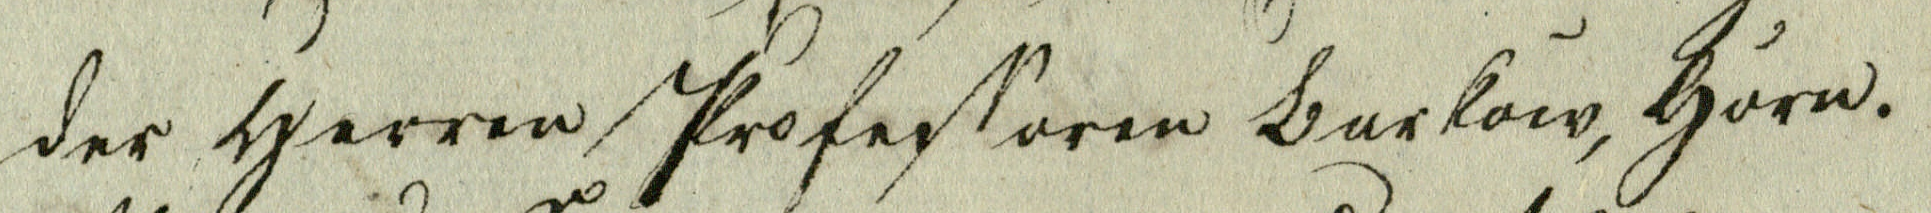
der Herren Professoren Barkow, Horn¬
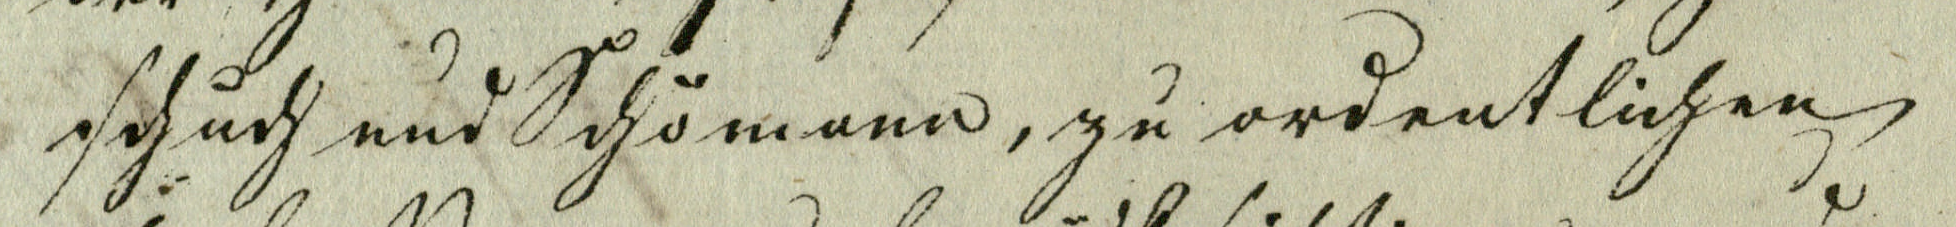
schuch und Schömann, zu ordentlichen
